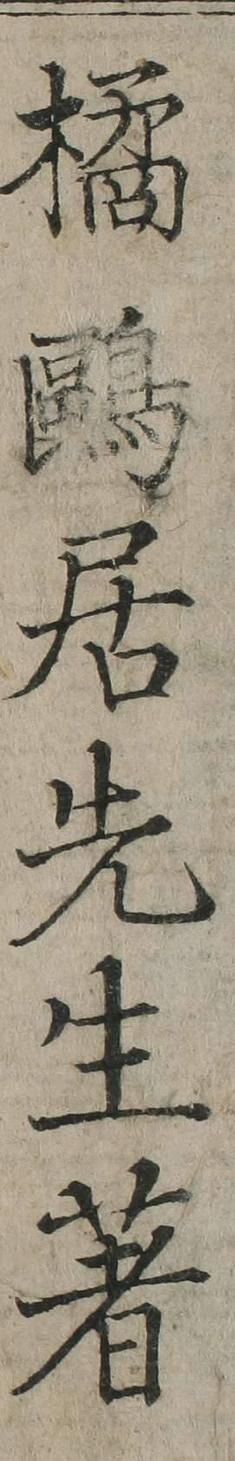橘鴎居先生著
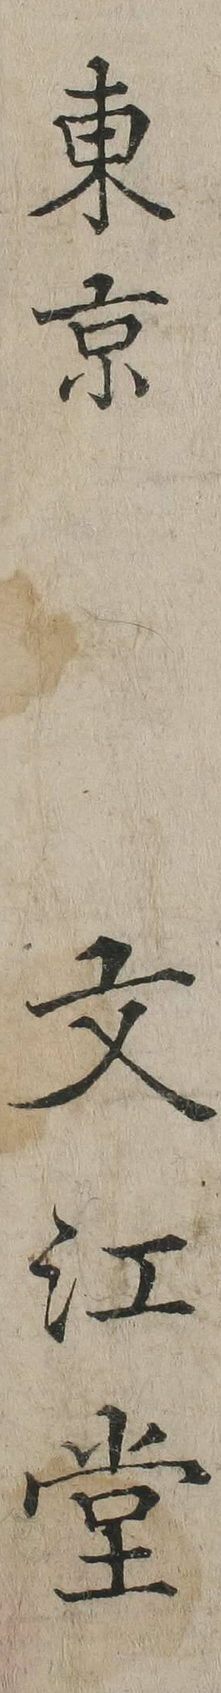東京文江堂
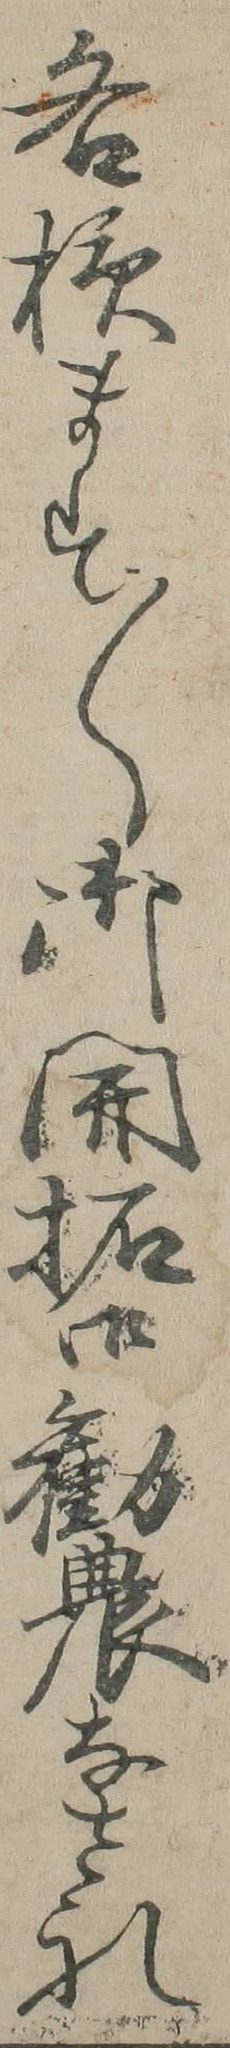各様ます〳〵御開拓御勧農なされ
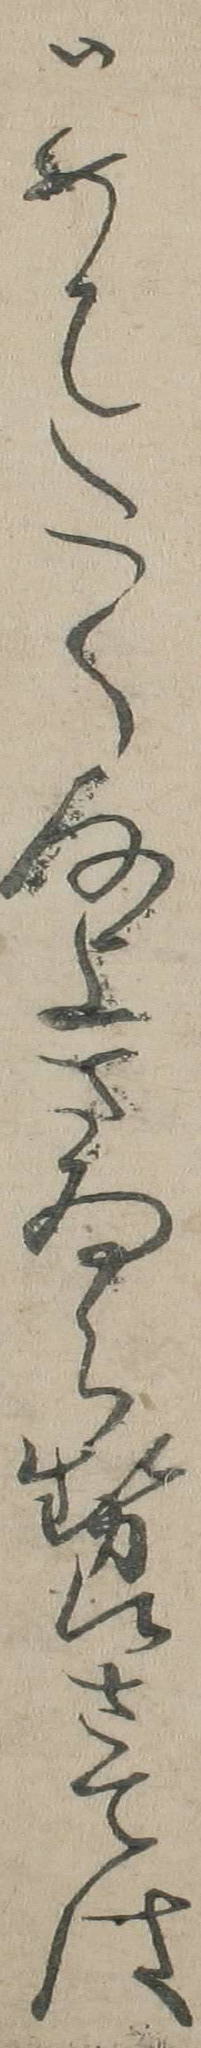御めてたく存上まゐらせ候さては
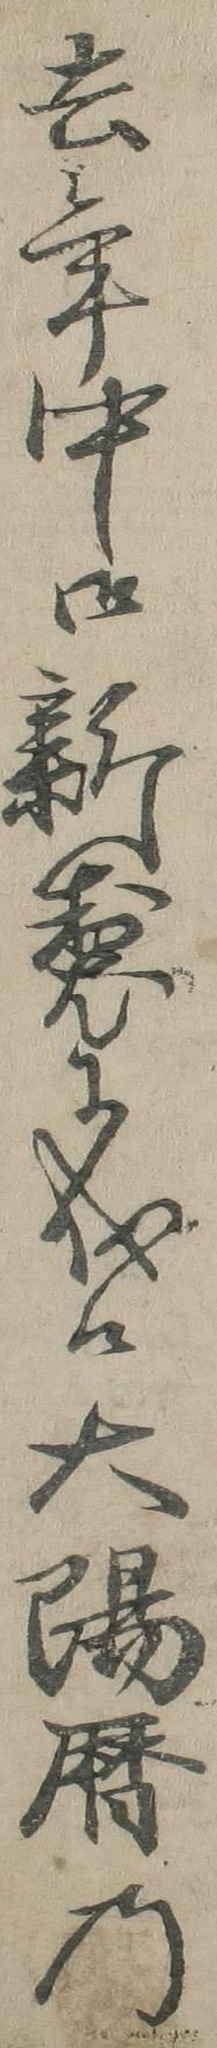去年中御新製に成候太陽暦の
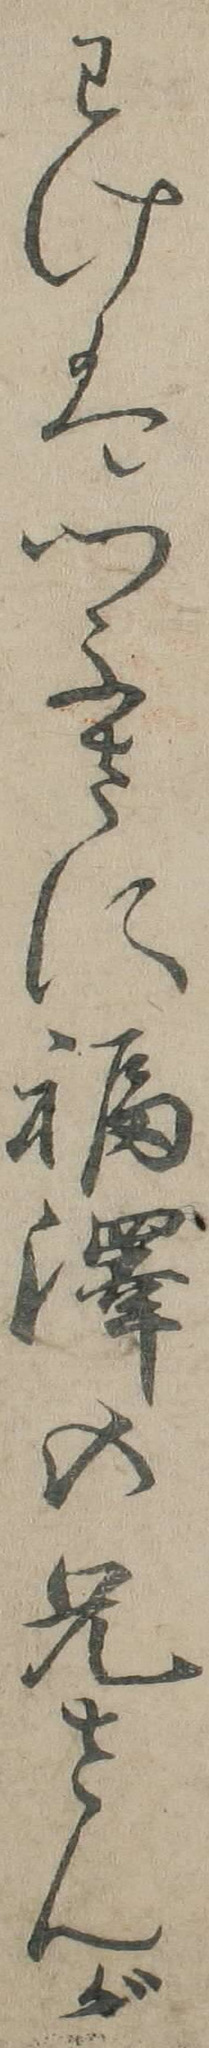わけはつふさに福沢の兄さんが
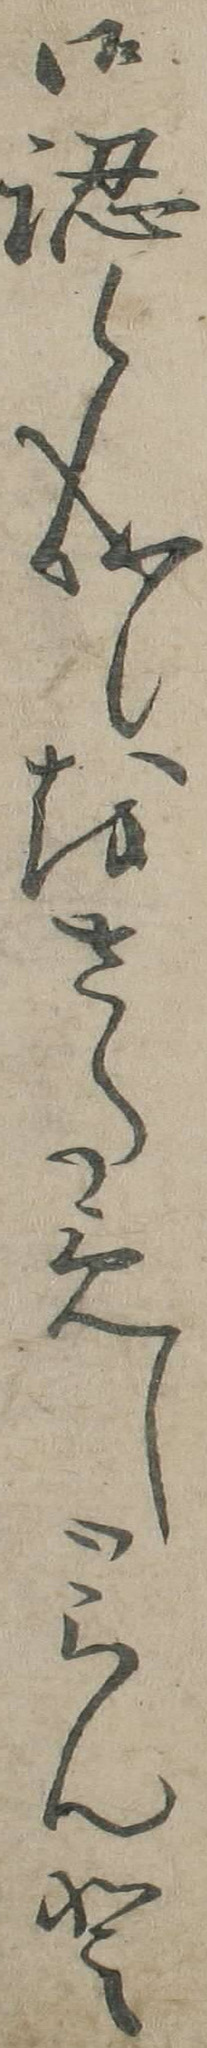御認被成候をさためし御らんと
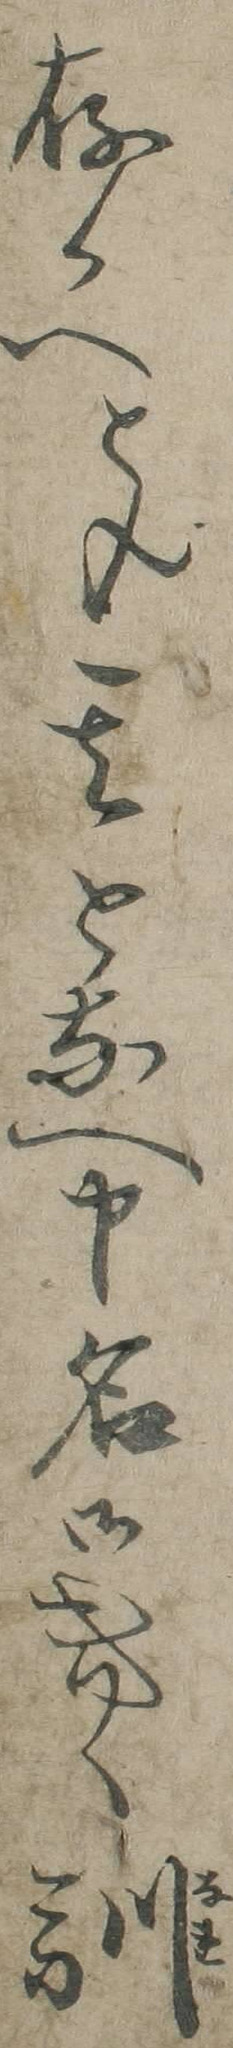存候へとも其となへ申名御きゝ馴

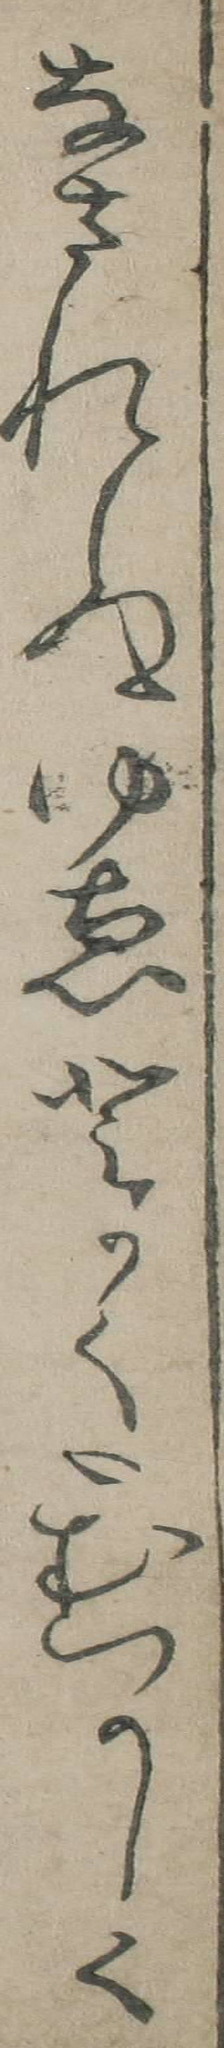なされぬゆゑとかく。むつかしく
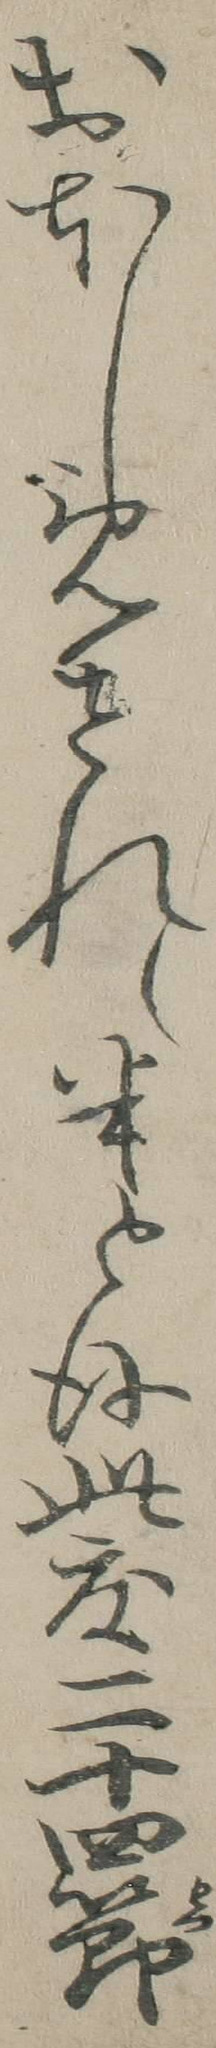おほしめされしはと後此度二十四節
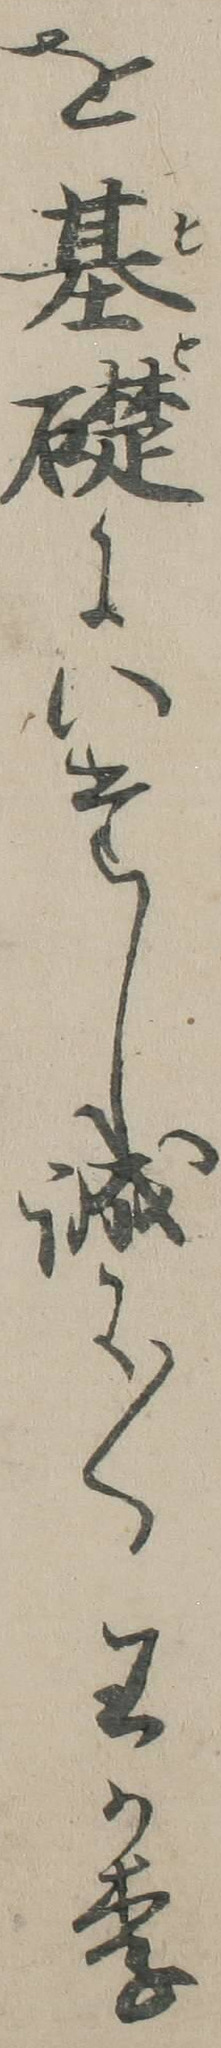を基礎にいたし誠に〳〵ゝわかり
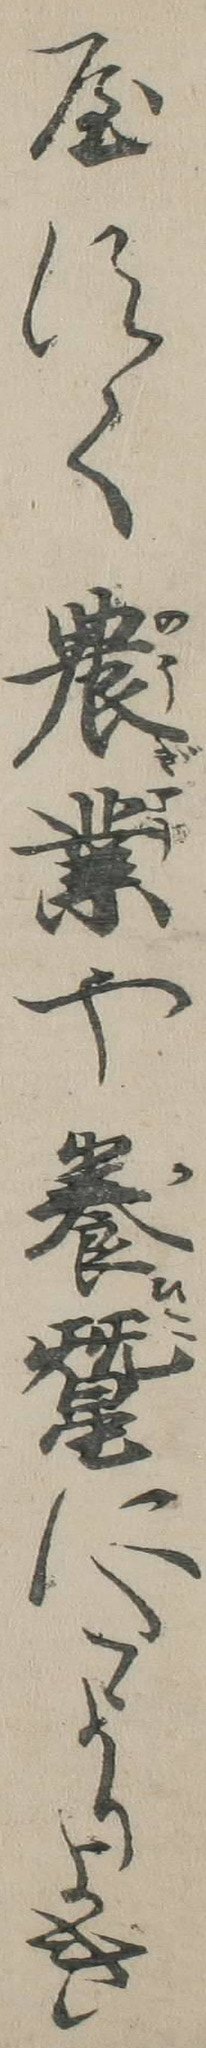やすく農業や養蚕のたよりよき
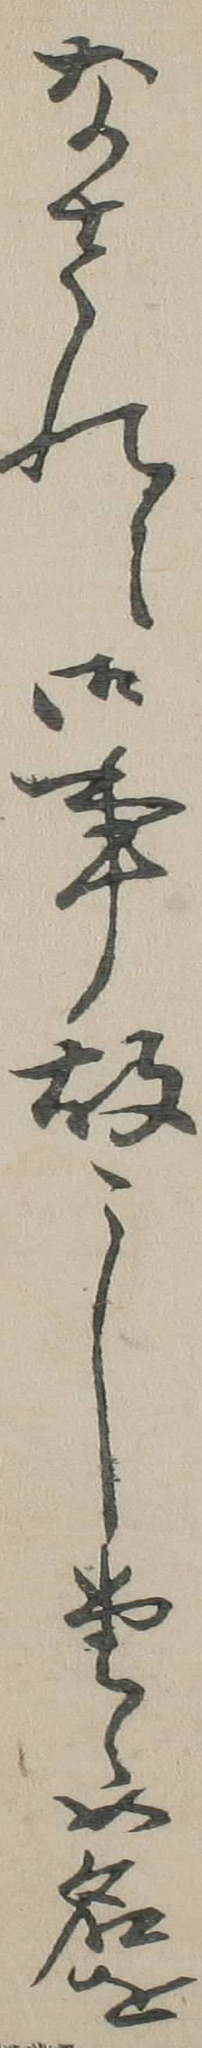なされし御事故したゝめ名を
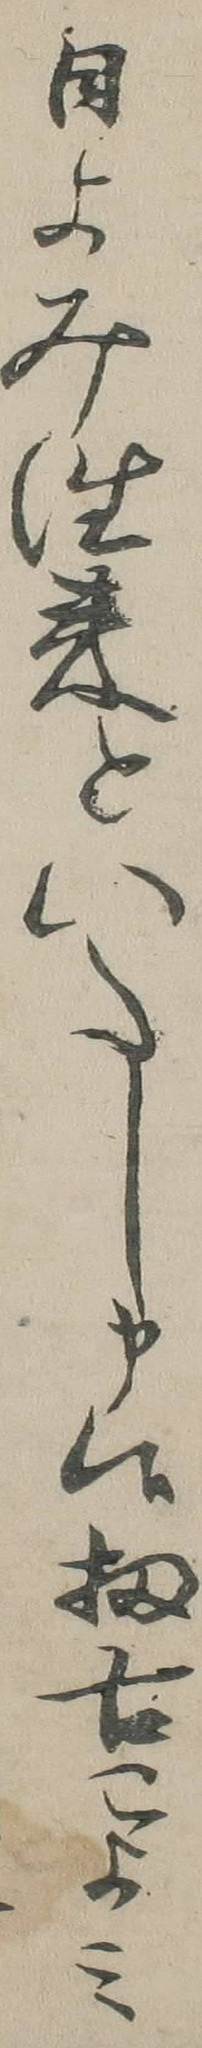日よみ往来といたし申候扨古こよみ
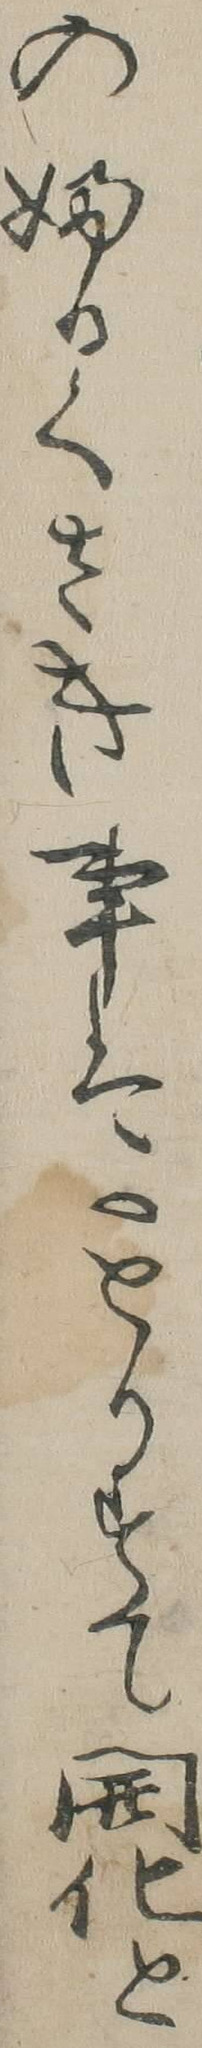のふるくさき事は。とりすて開化と
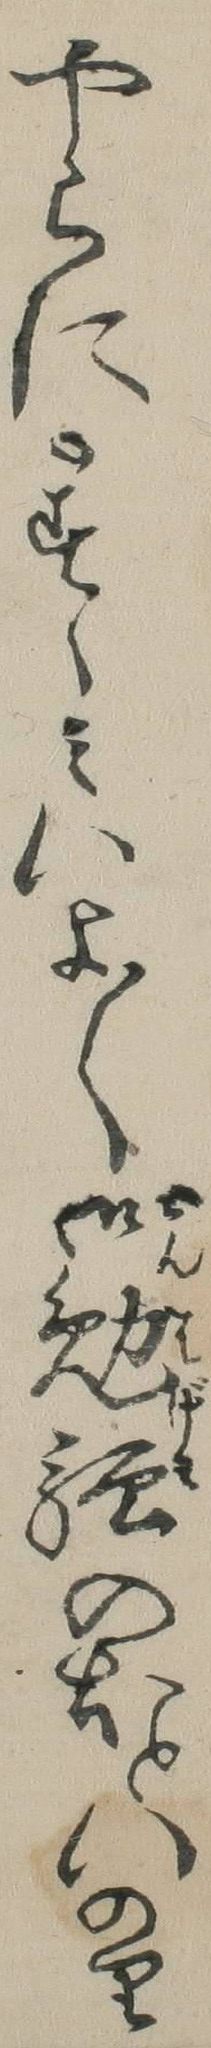やらに。すゝみいよ〳〵御勉強のほといのり
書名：農蠶必要日読往来
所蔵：東京学芸大学附属図書館 国文学研究資料館
